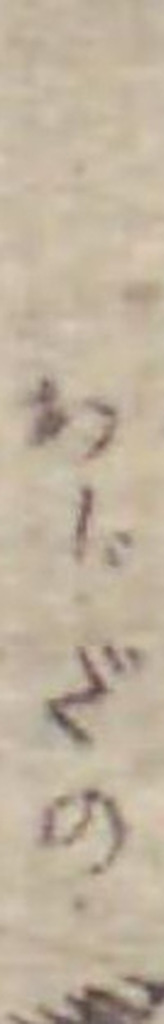あじだの

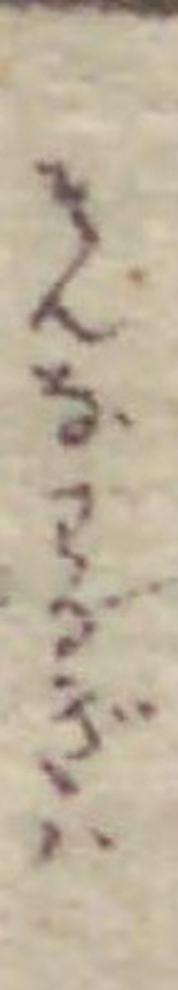そんなわるぎは
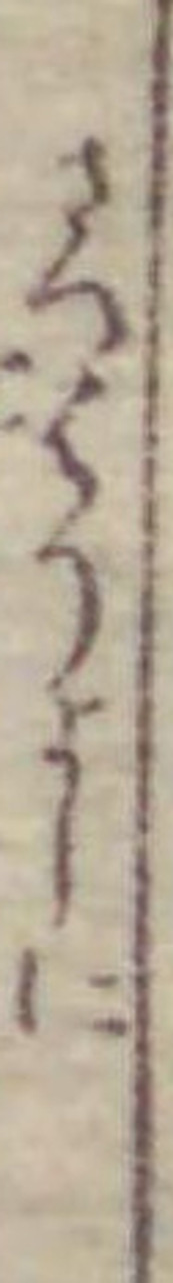さつはりよしに
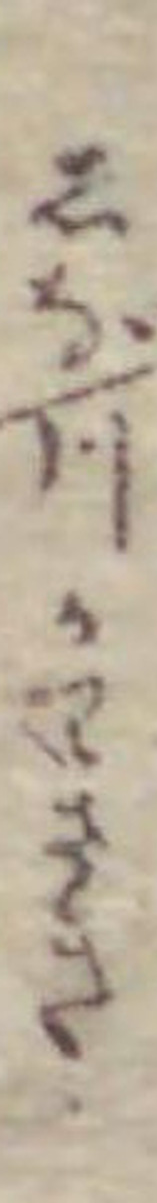しな川かわささき
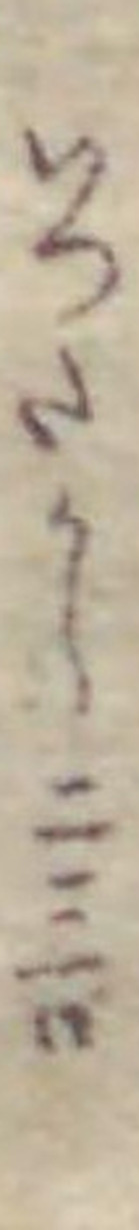いつたから二三日
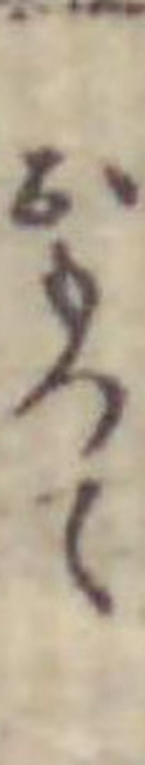おもつて
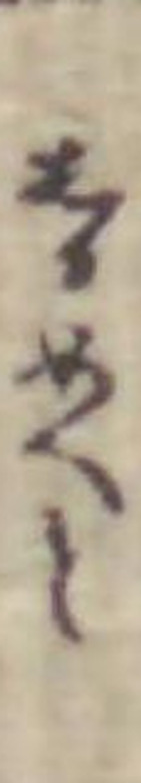しるめへと
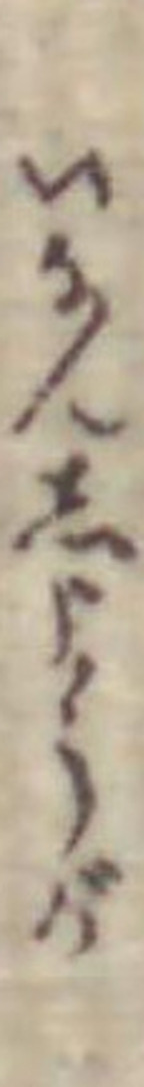いなんしようが
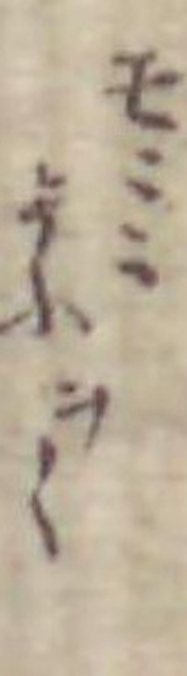よふをく
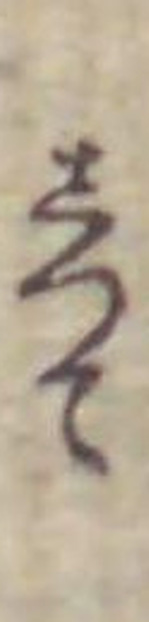しつて
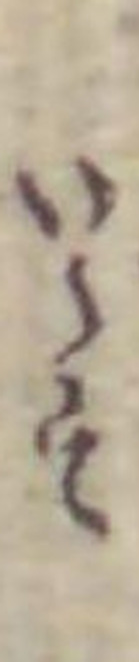いらす

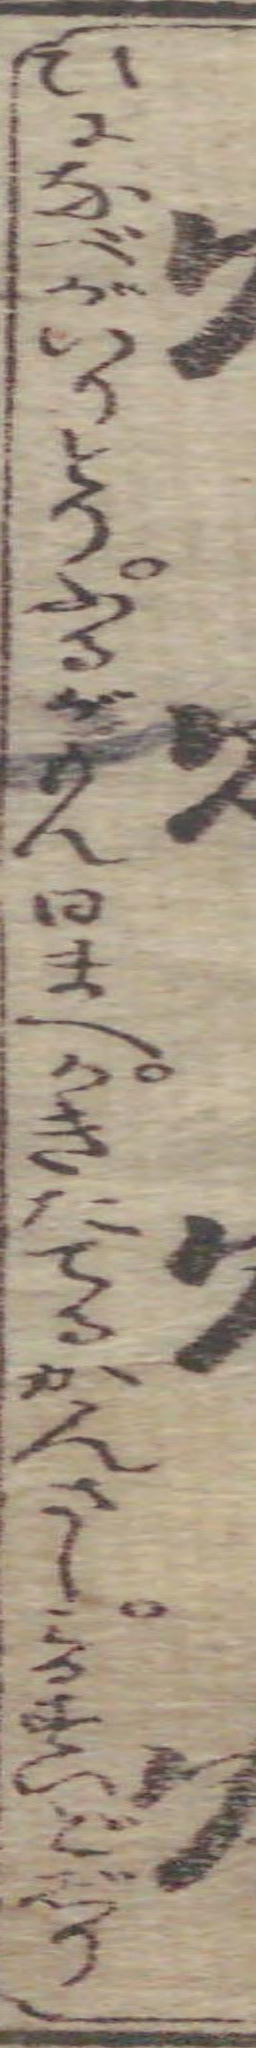ひになべがいりとり。ふるがもん日まへ。かきたてるかんさし。みるすいどじり
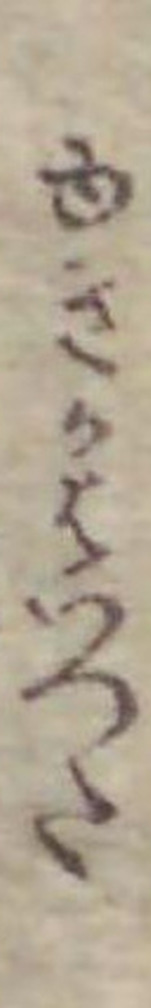ゆきかはいつた
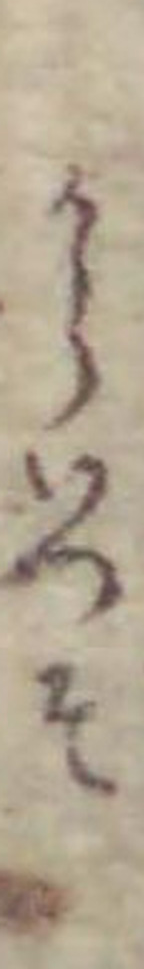からいつそ
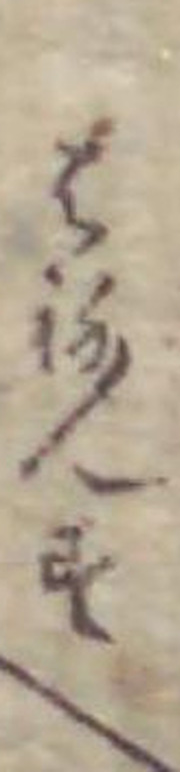はねんす
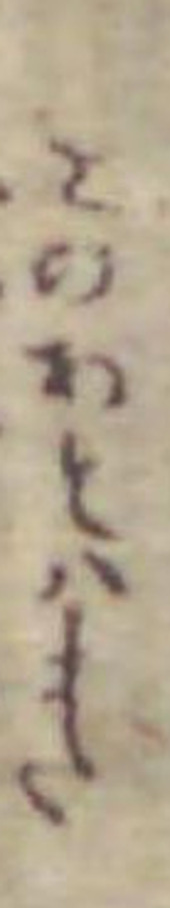このあとはまた
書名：郭𦽳費字尽 : 3巻
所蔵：国立国会図書館 National Diet Library, JAPAN
